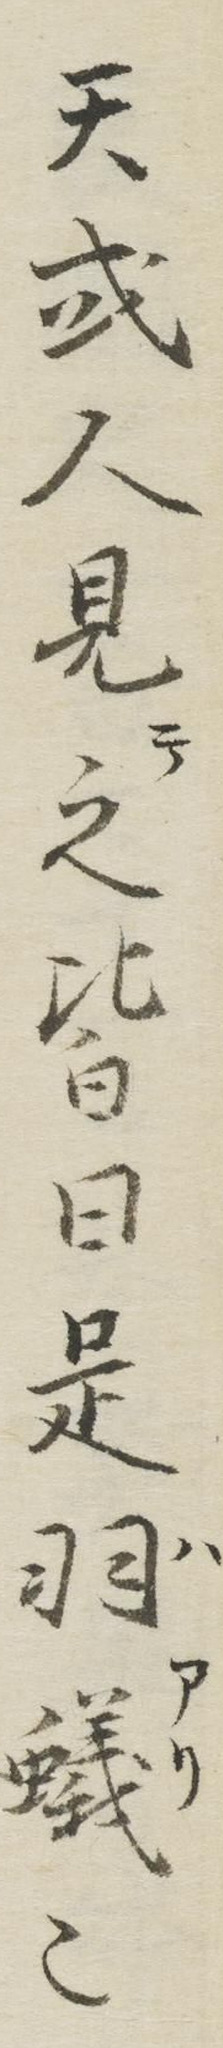天或人見之皆曰是羽蟻也
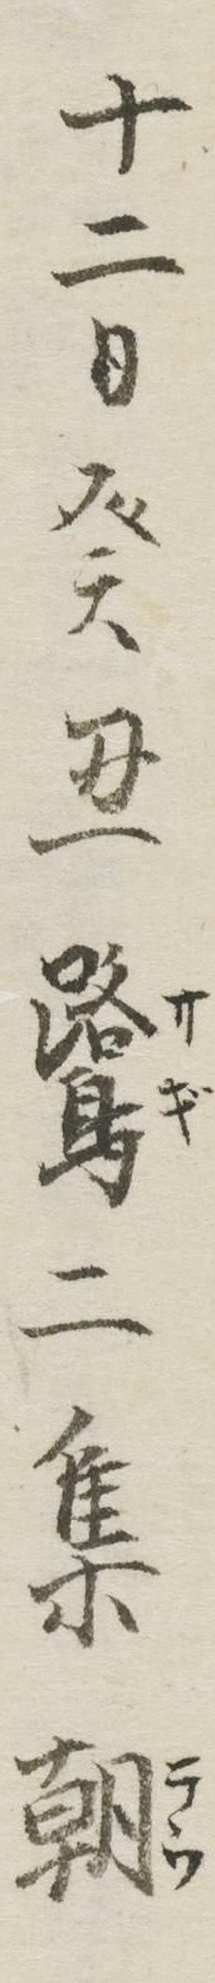十二日癸丑鷺二集朝
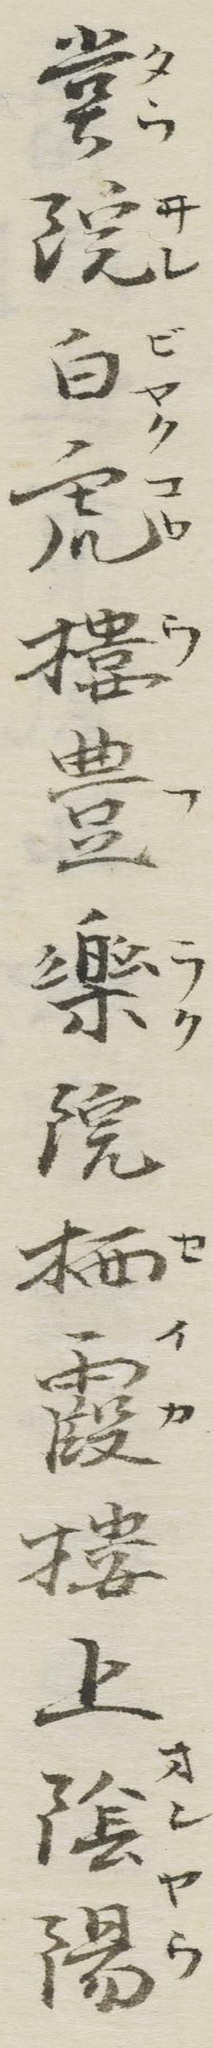堂院白虎楼豊楽院栖霞楼上陰陽
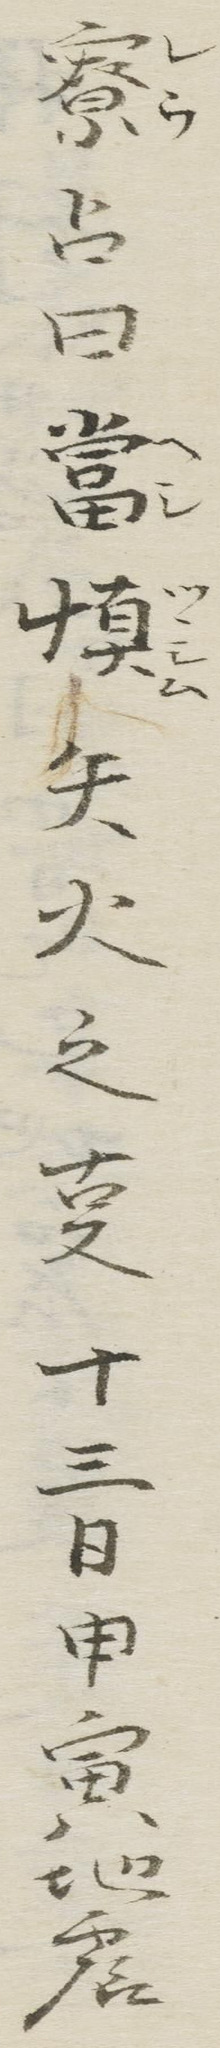寮占曰当慎失火之事十三日申寅地震
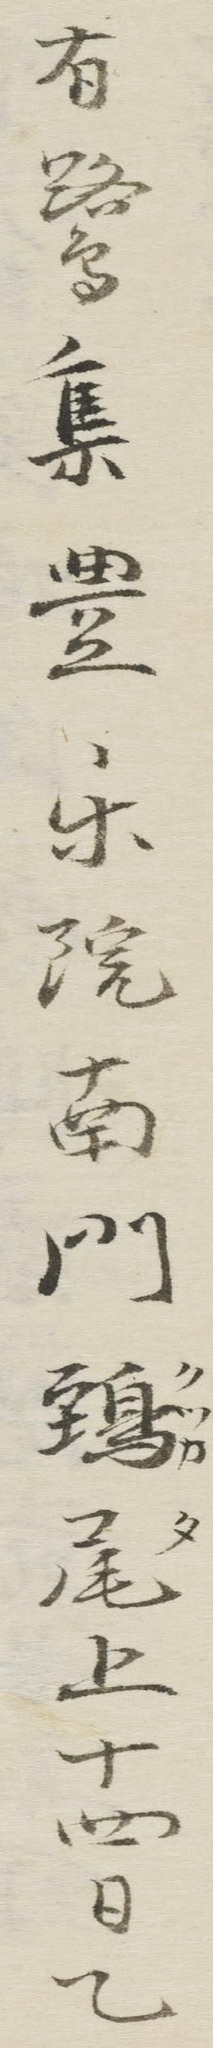有鷺集豊楽院南門鵄尾上十四日乙
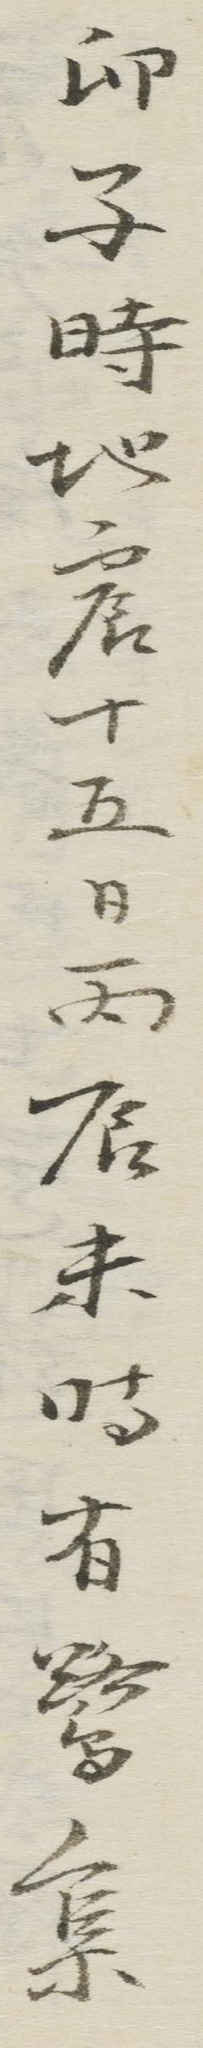卯子時地震十五日丙辰未時有鷺集
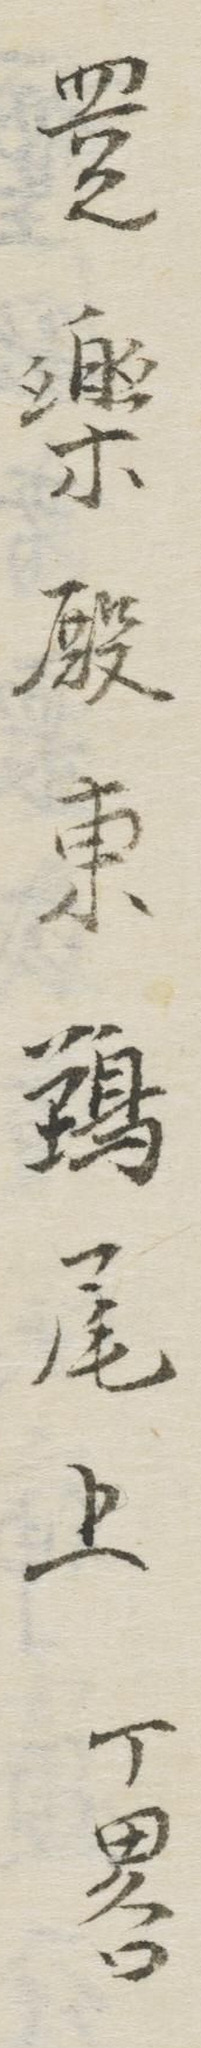豊楽殿東鵄尾上丁略
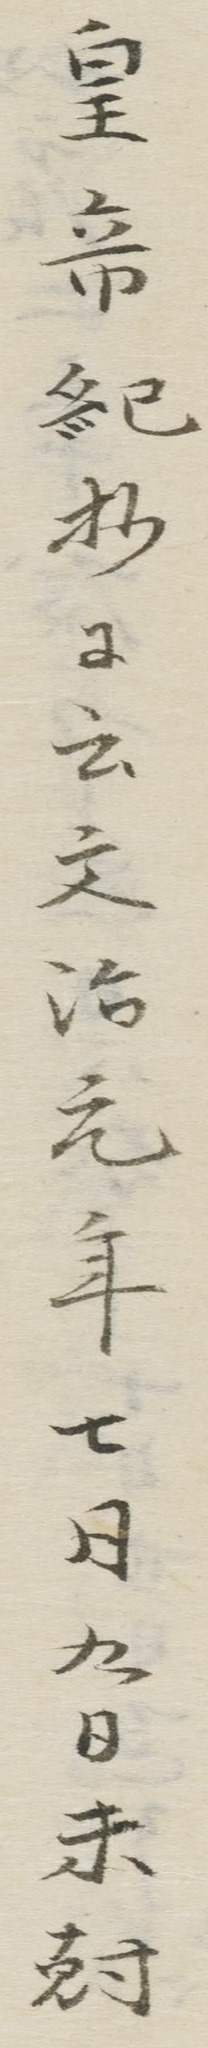皇帝紀抄に云文治元年七月九日未刻
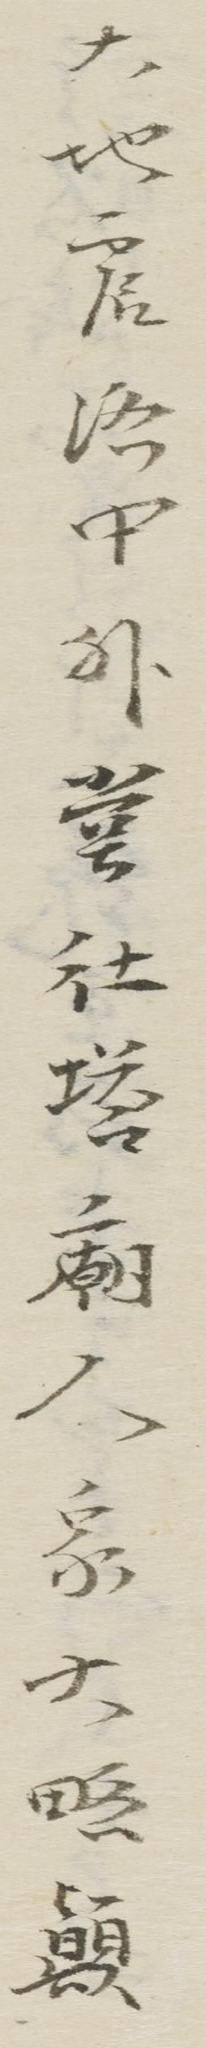大地震洛中外堂社塔廟人家大略顚
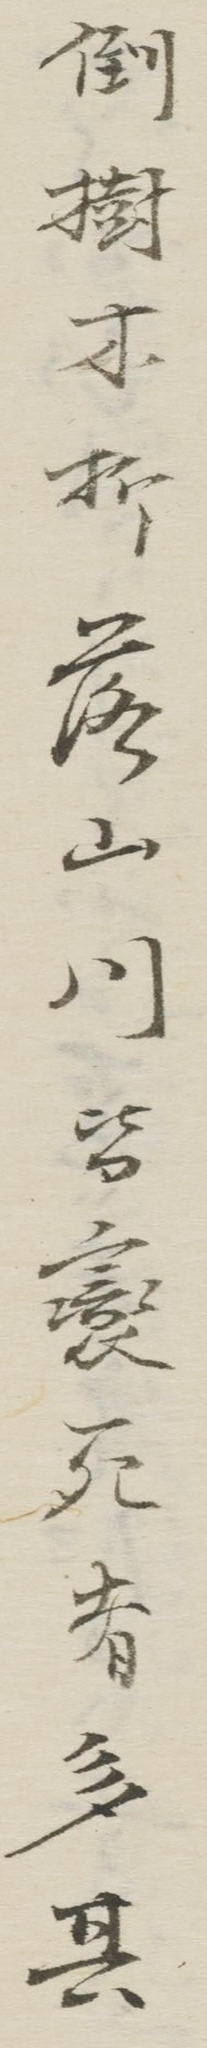倒樹木折落山川皆変死者多其
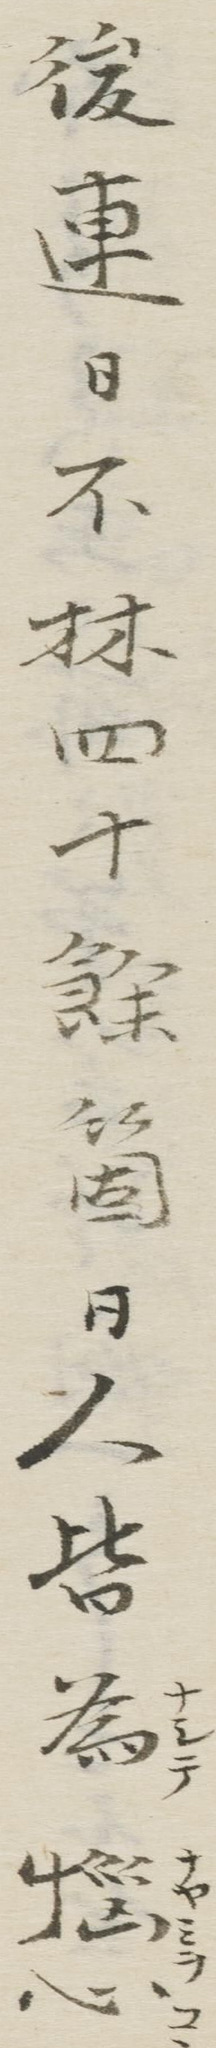後連日不林四十余箇日人皆為悩心
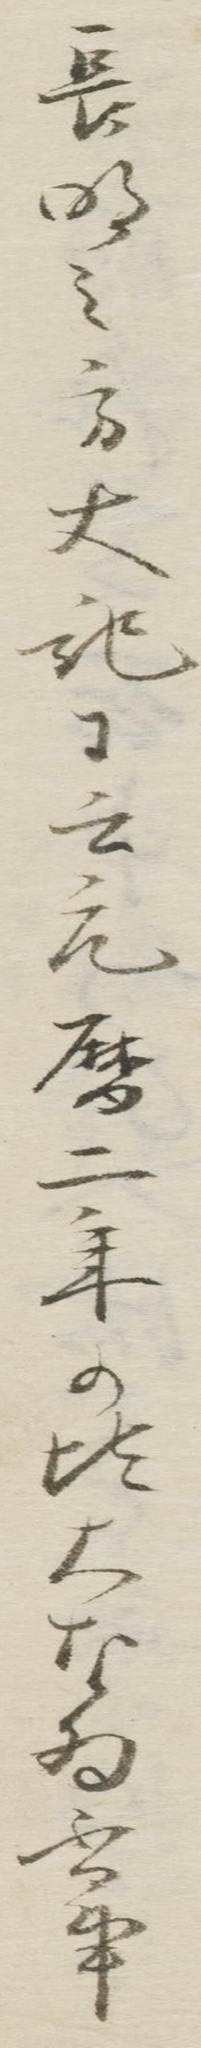長明之方丈記に云元暦二年の頃大なゐふる事
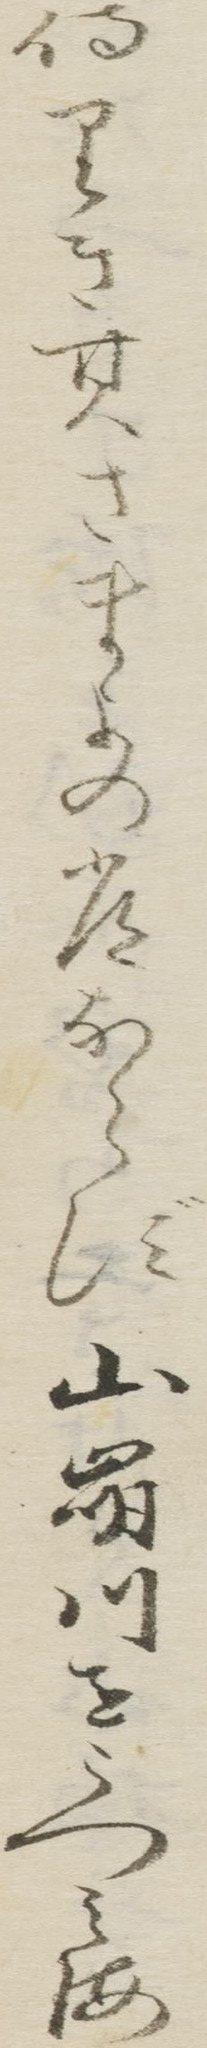侍りき其さまよの常ならず山崩川をうつミ海

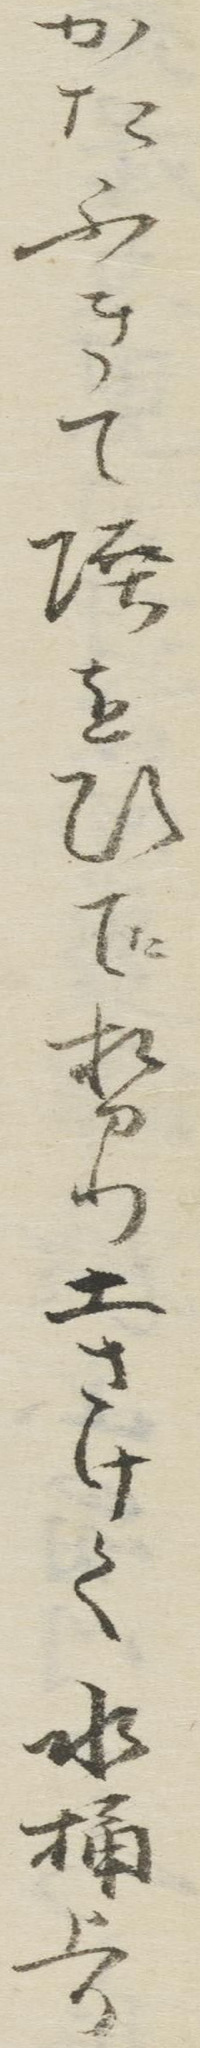かたふきて陸をひたせり土さけて水桶上り
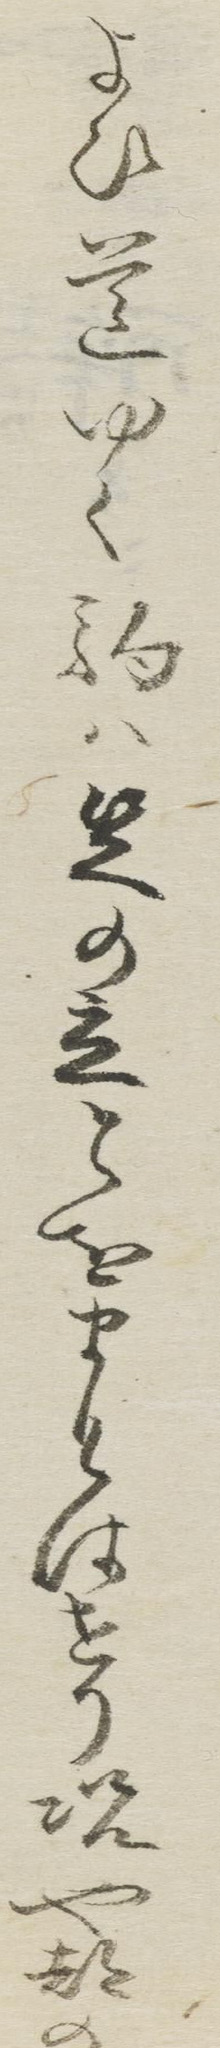よひ道ゆく駒ハ足の立てをまとはせり況や都の
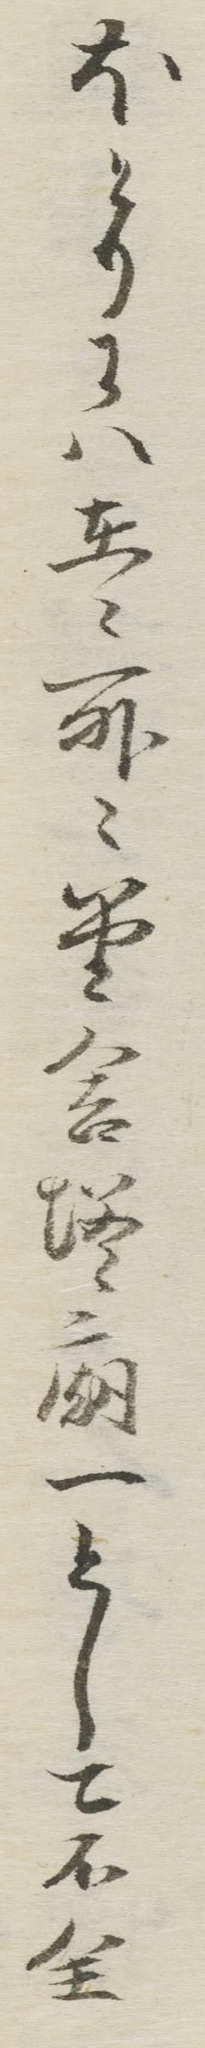ほとりには在々所々堂舎塔廟一として不全
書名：諸国大地震大津波一代記
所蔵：東京大学地震研究所図書室 Earthquake Research Institute Library, The University of Tokyo, JAPAN
